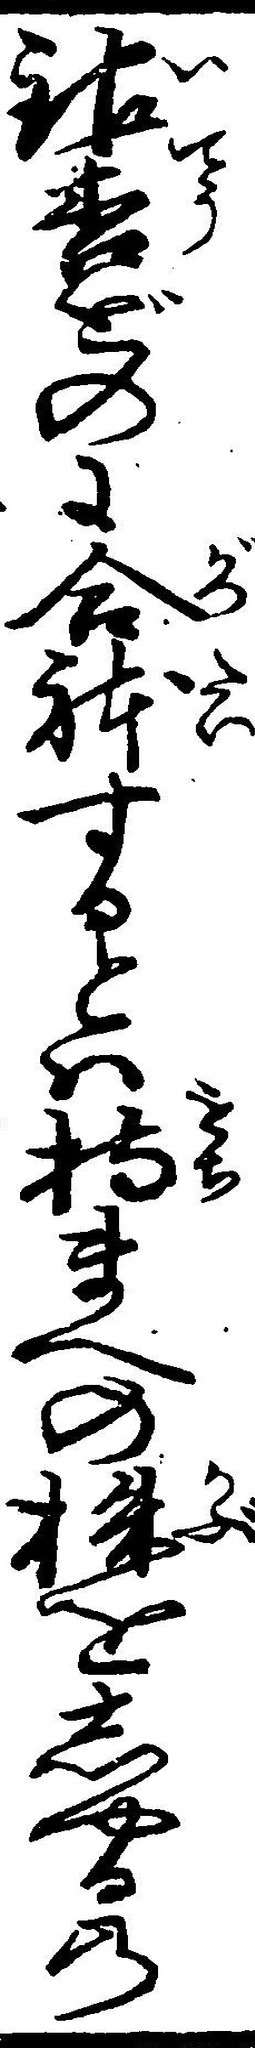銀杏どのに合体するとは持まへの株をしやるの
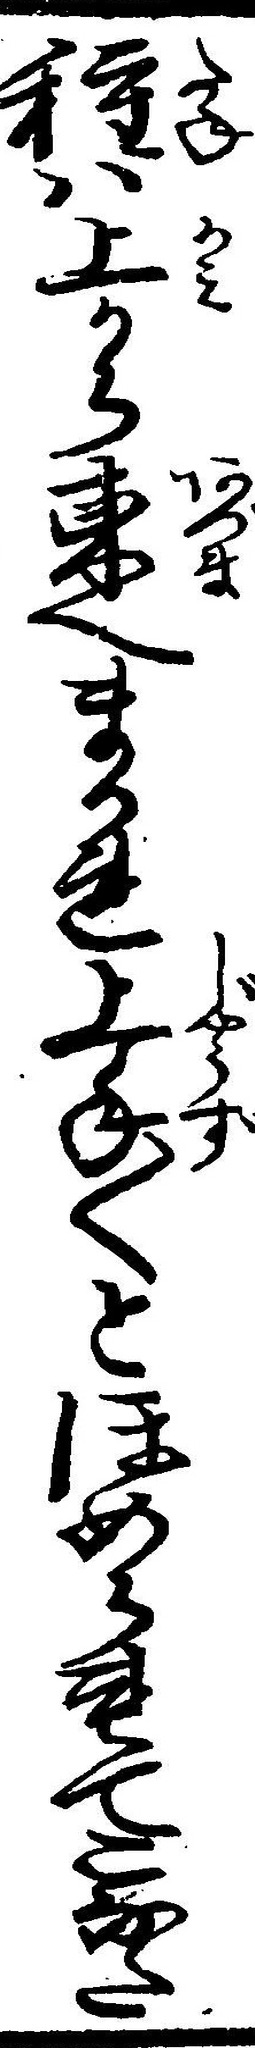種は上から東へまかれ上手〳〵とほめられてこなた
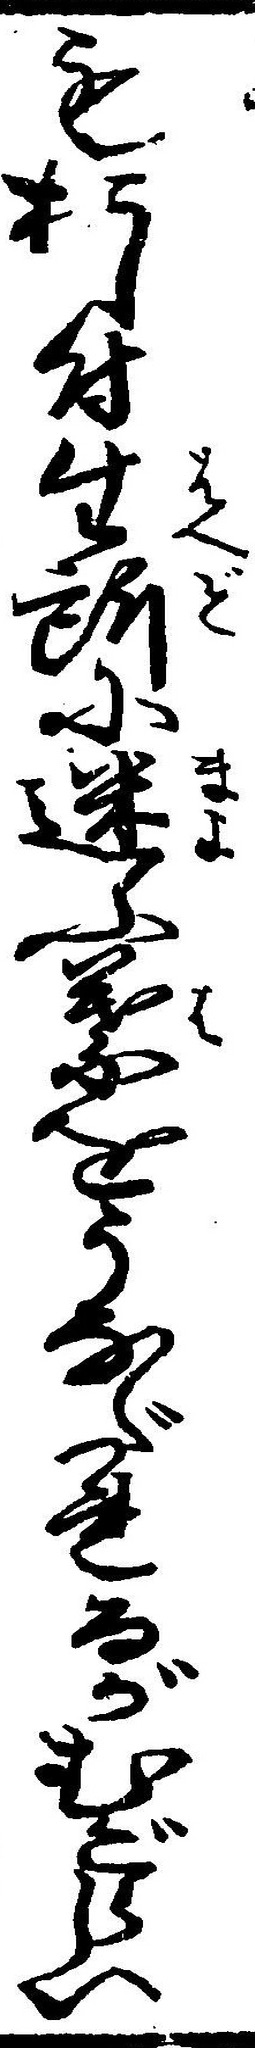もおし付生所に迷ふ葉をうなだれるがむごらしい
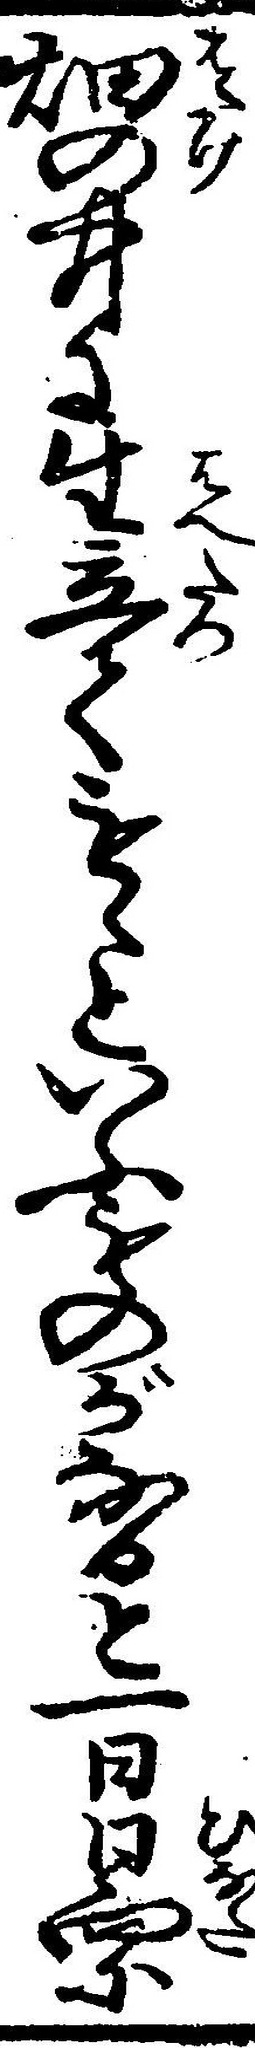畑の中に生立てもゝといふものがなると一日日向に
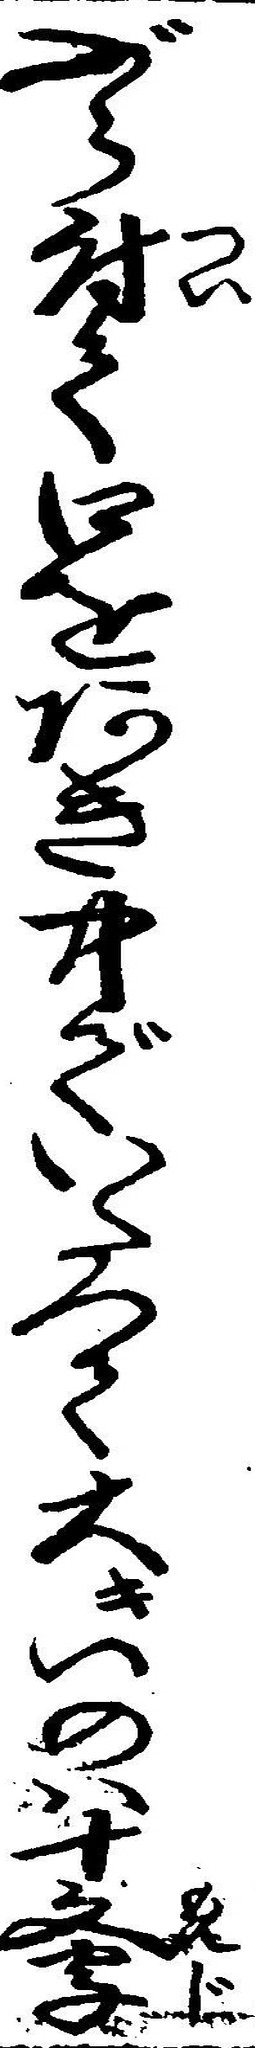ぶら付て口をあき中でいたつて大いのは十文字
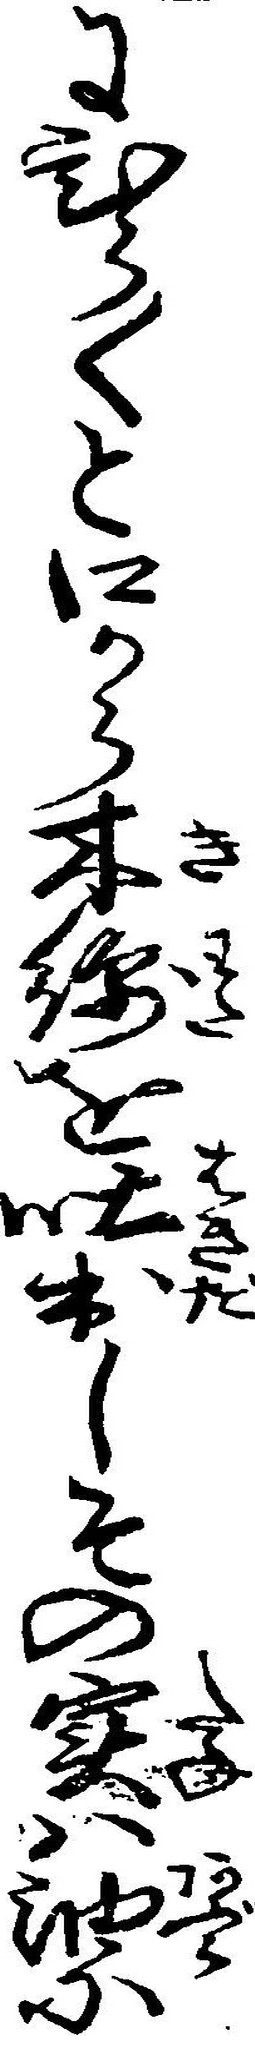にひら〳〵と口から木綿を吐出しその実は油に
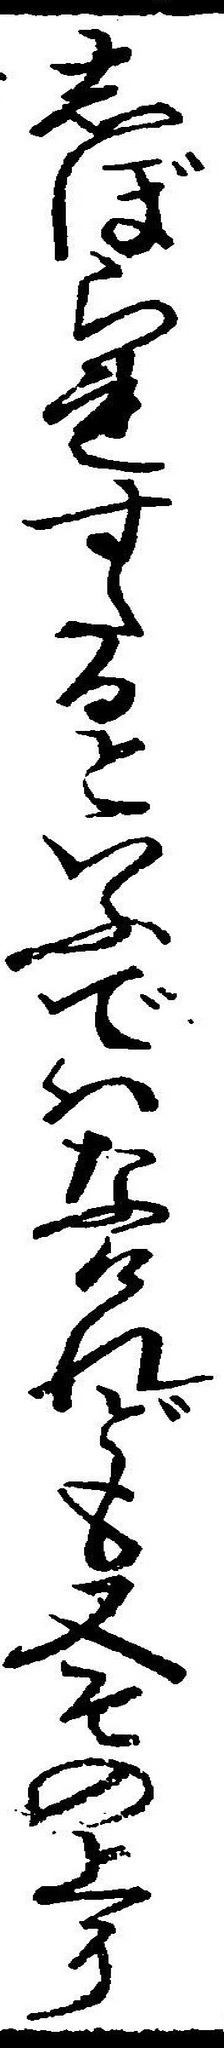しぼられすたるといふではなけれども又その上に
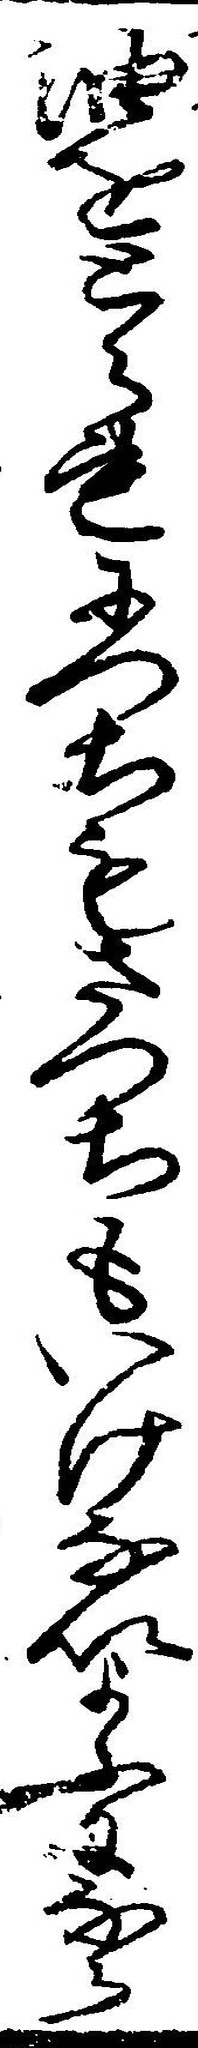油をとられにつちもさつちもいけないよふになら
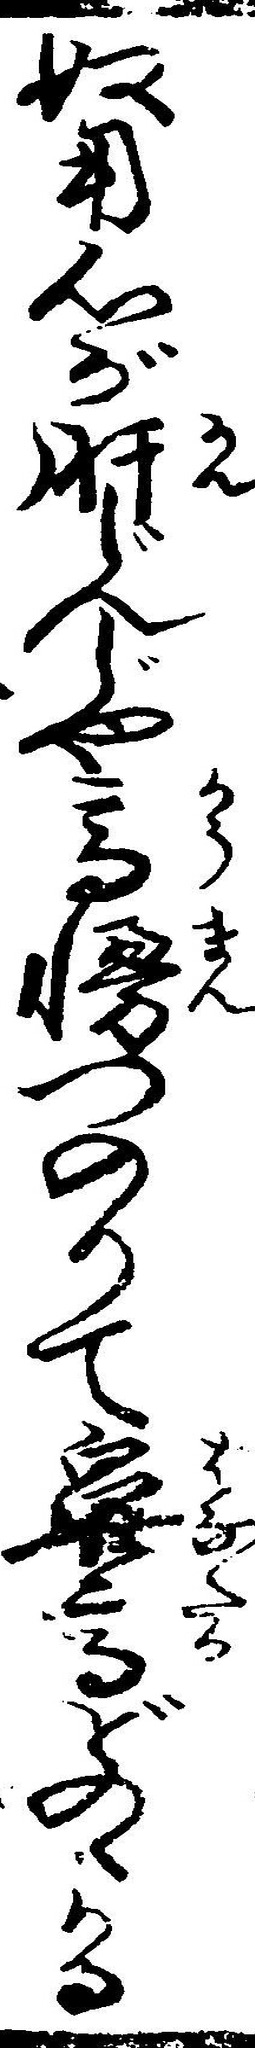ぬ用心が肝じんじや高慢つのりて鼻高どのゝかる
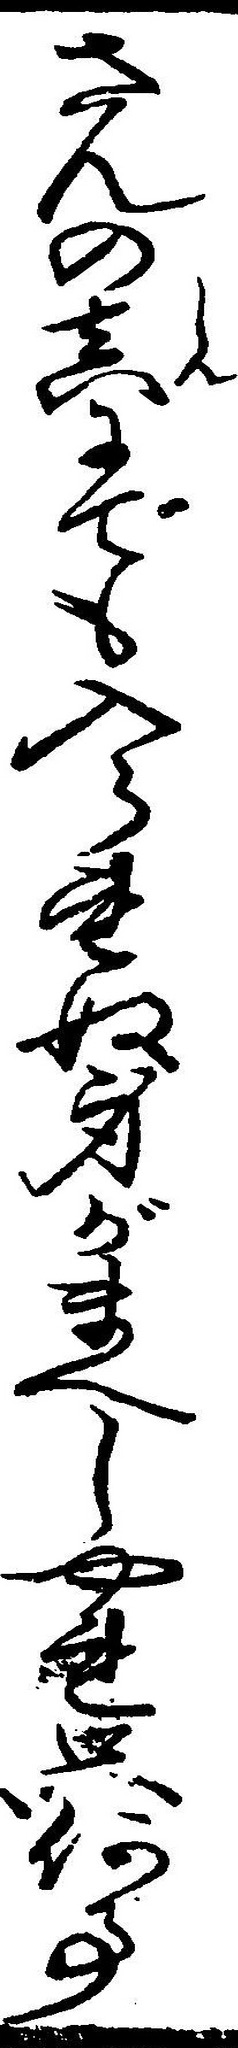さんの真にでも入られぬ身がまへしやれ只何事
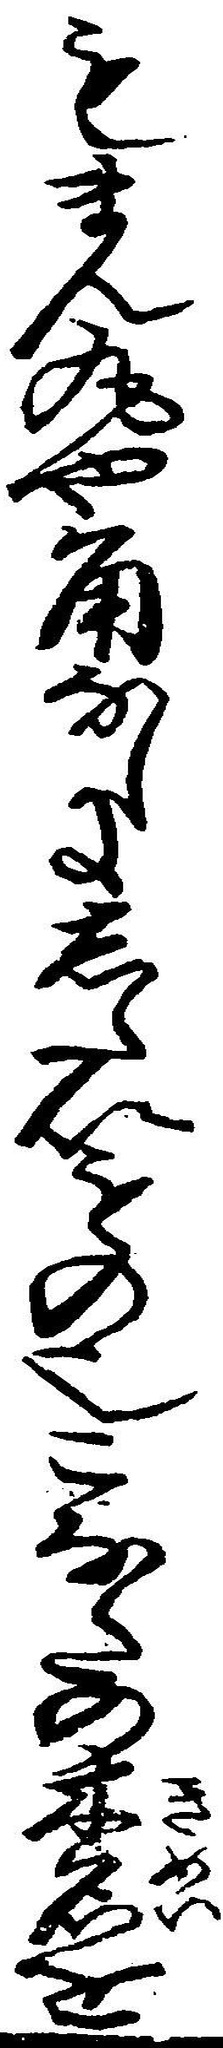もまん丸や角なしにしたいもの也こなたの木名を

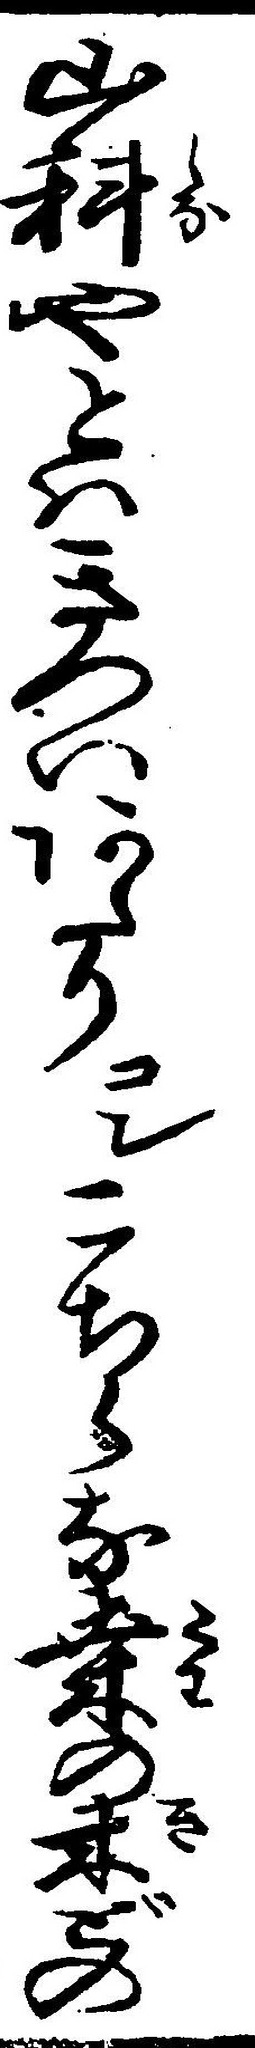山科やとはきついあたりコレこちらな桑の木どの
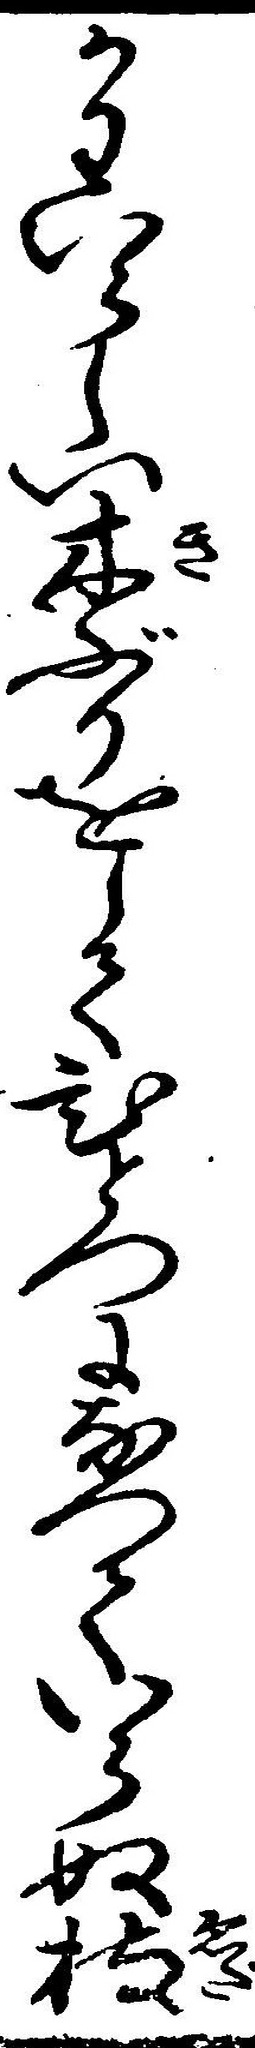かわいらしい木ぶりをしてひとつになつていらぬ枝
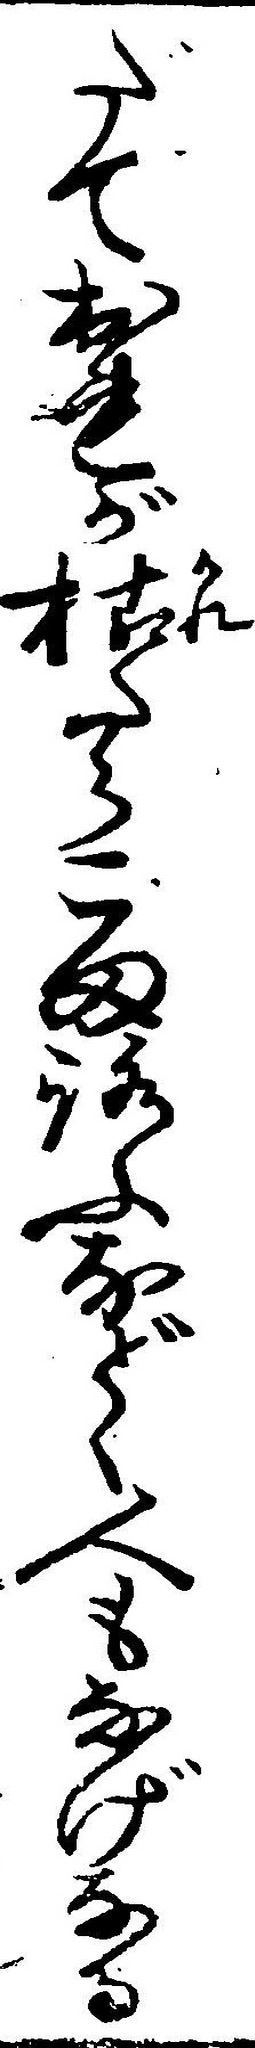たておれが枯たらこまろふなどゝ人もなげなる
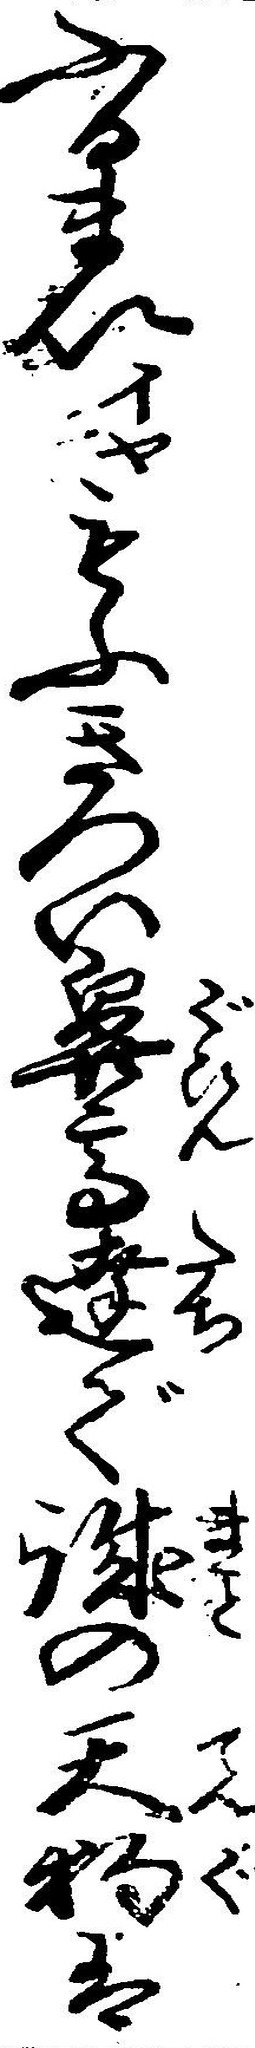ふるまいイヤもふきつい鼻高達で誠の天狗は
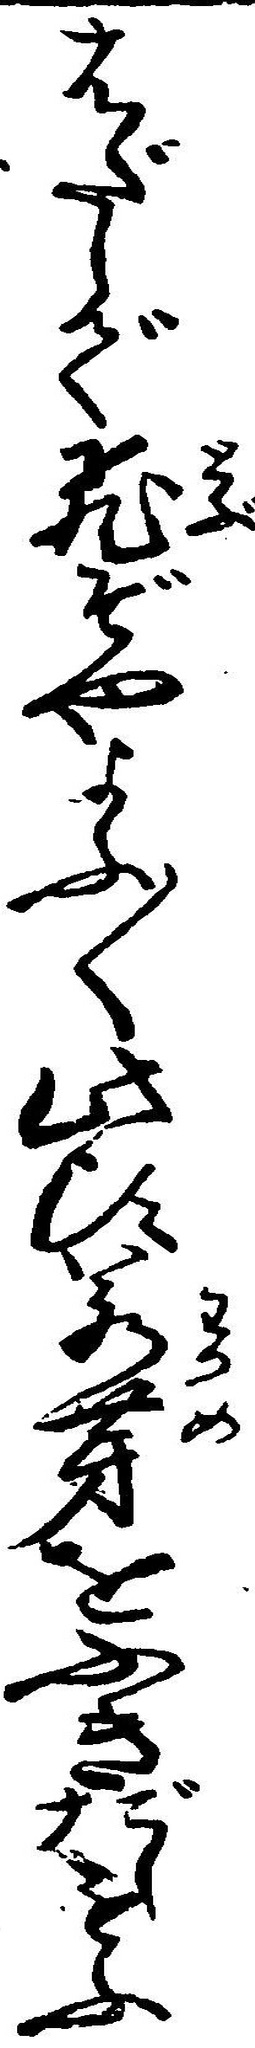はだしで飛ぞやよふ〳〵此頃若芽をふきだしをふ
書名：草木芝居化物退治 / 泉花堂三蝶(十六兵衛)作
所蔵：東京大学総合図書館 General Library in the University of Tokyo, JAPAN
